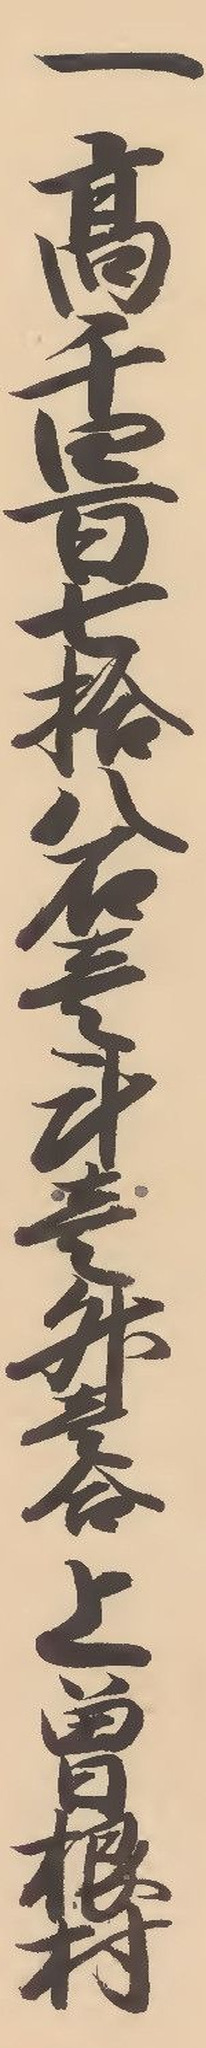一高千四百七拾八石壱斗壱升壱合上曽根村

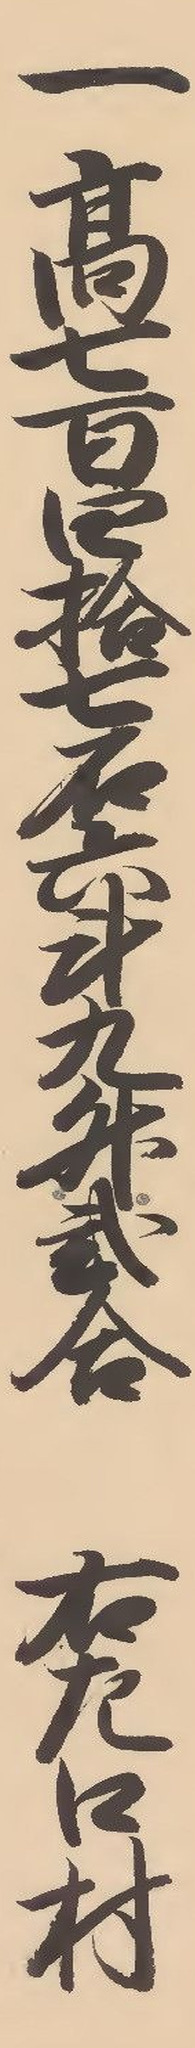一高七百四拾七石六斗九升弐合右左口村
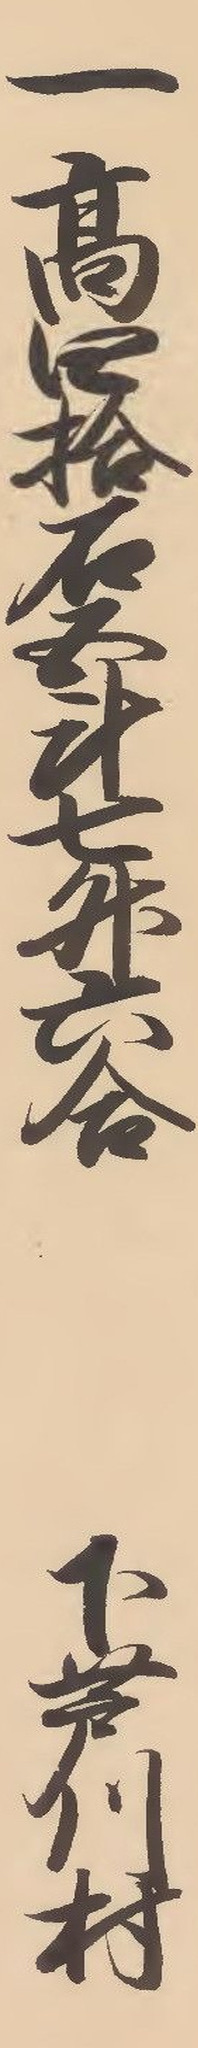一高四拾石五斗七升六合下芦川村
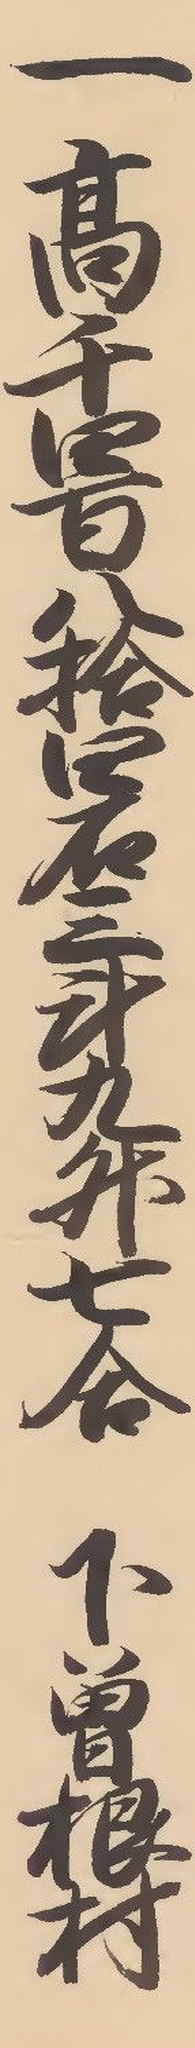一高千四百八拾四石三斗九升七合下曽根村
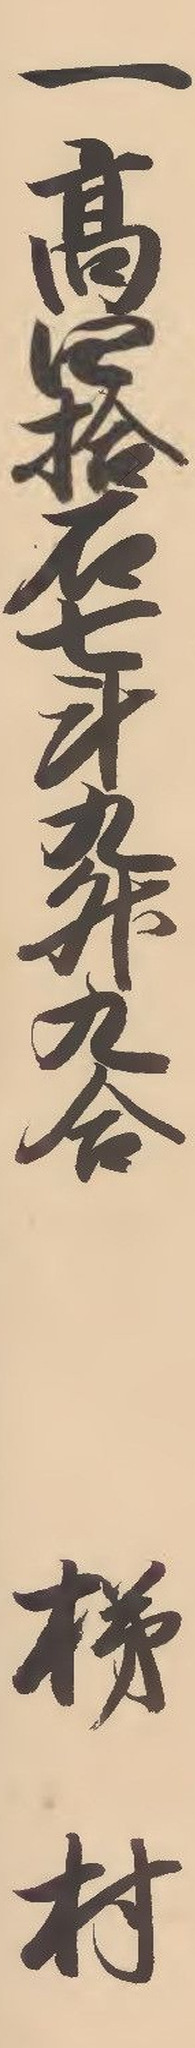一高四拾石七斗九升九合柿村
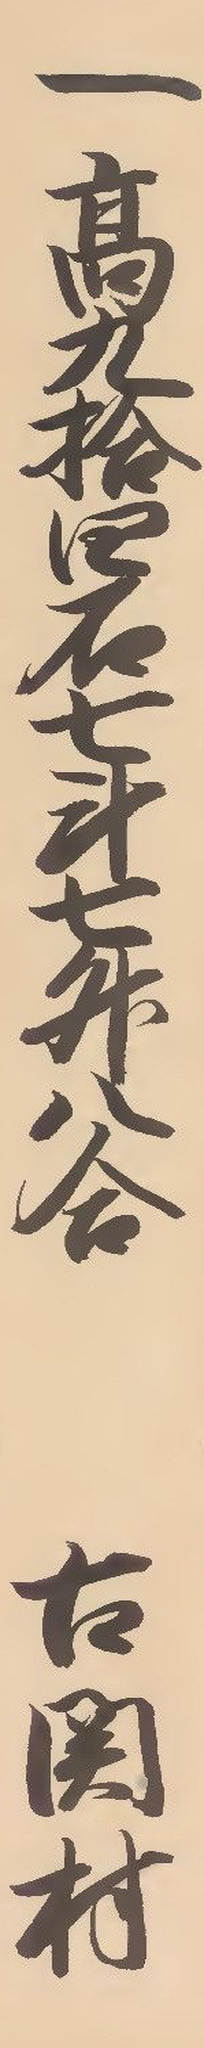一高九拾四石七斗七升八合古関村
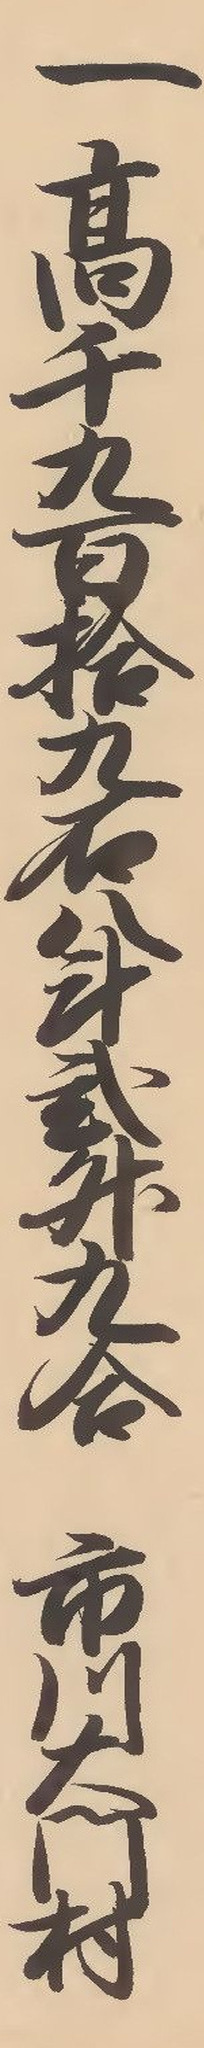一高千九百拾九石八斗弐升九合市川大門村
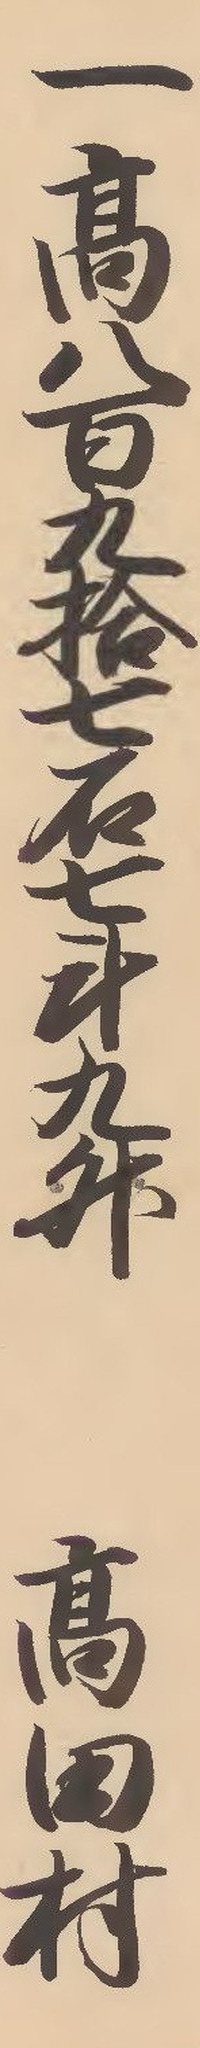一高八百九拾七石七斗九升高田村

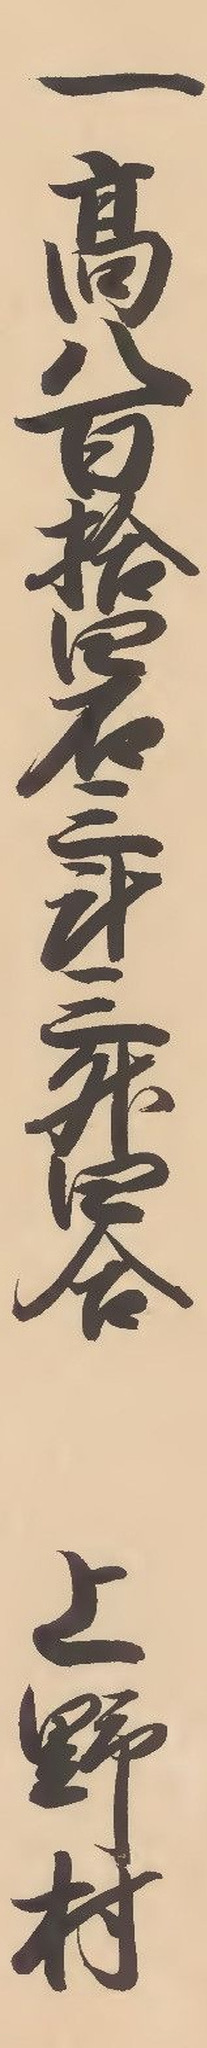一高八百拾四石三斗三升四合上野村
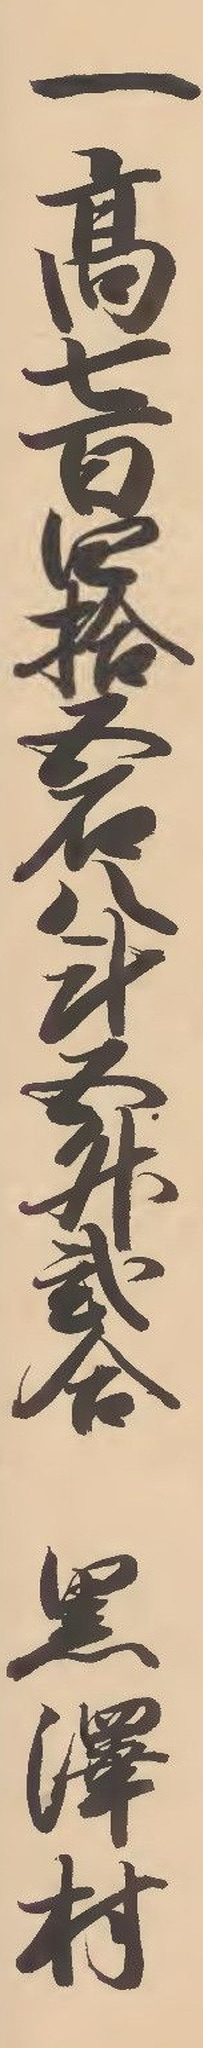一高七百四拾五石八斗五升弐合黒沢村
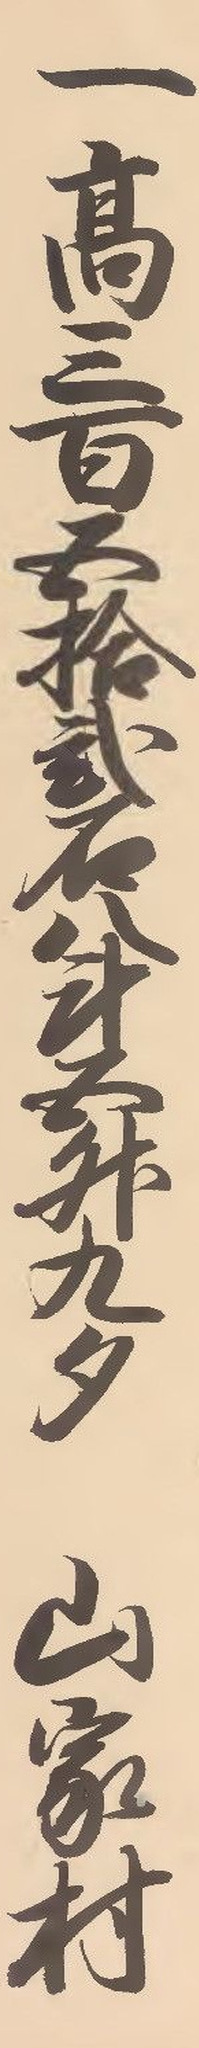一高三百五拾弐石八斗五升九勺山家村
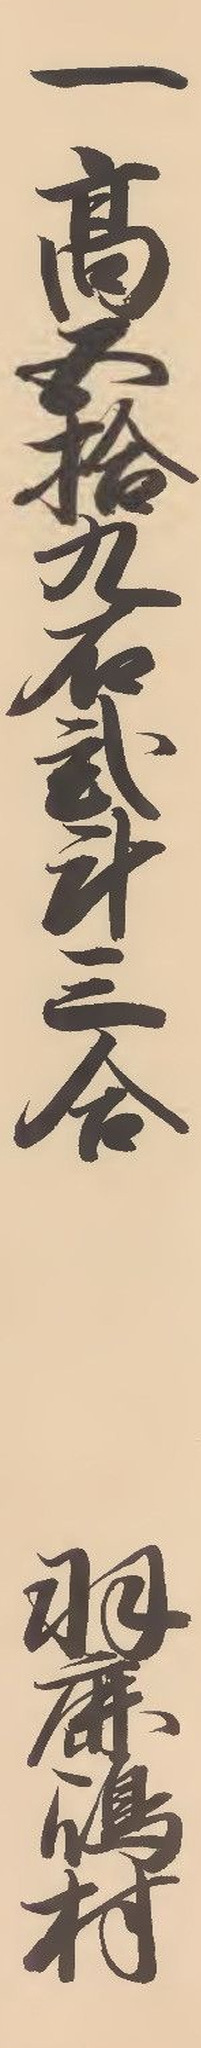一高五拾九石弐斗三合羽鹿島村
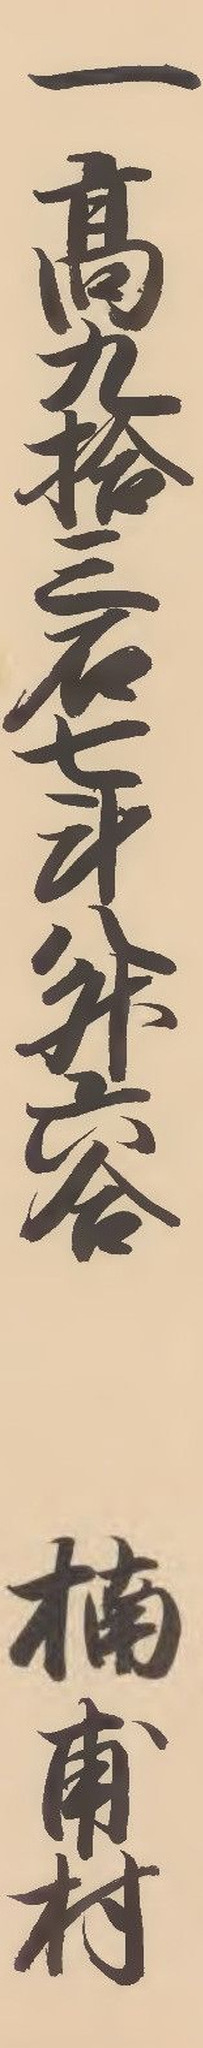一高九拾三石七斗八升六合楠甫村
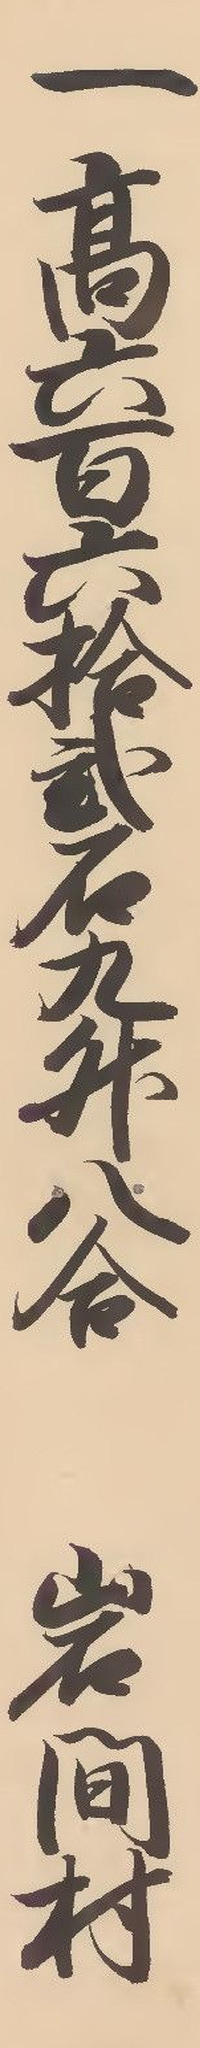一高六百六拾弐石九升八合岩間村

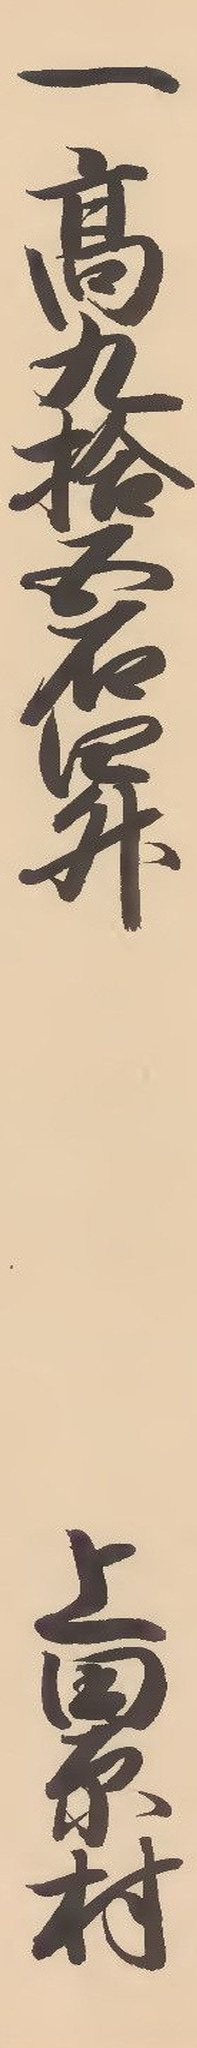一高九拾五石四升上田原村
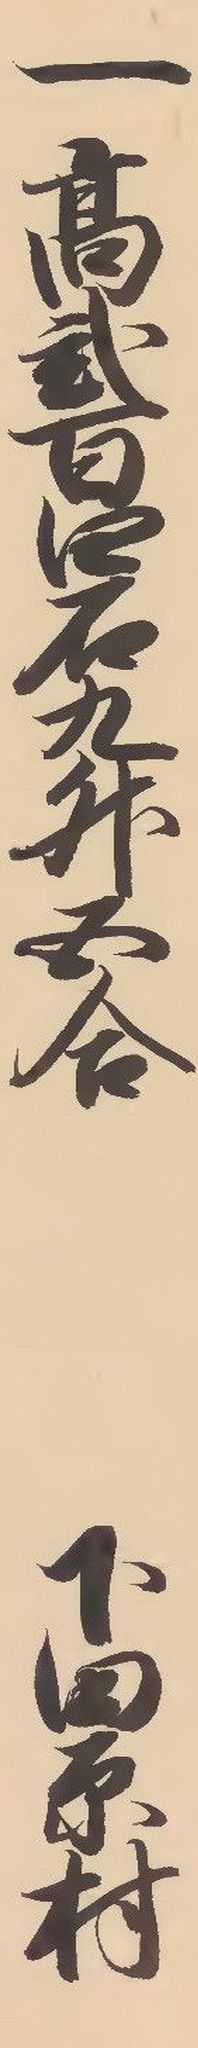一高弐百四石九升五合下田原村
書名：甲斐国郷帳
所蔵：国立公文書館 National Archives of Japan
